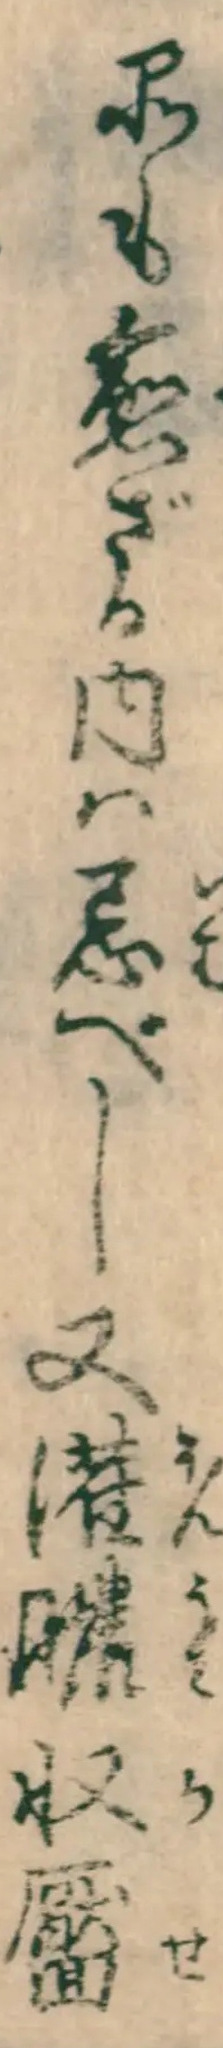品も癒ざる内は忌べし又潅膿収靨
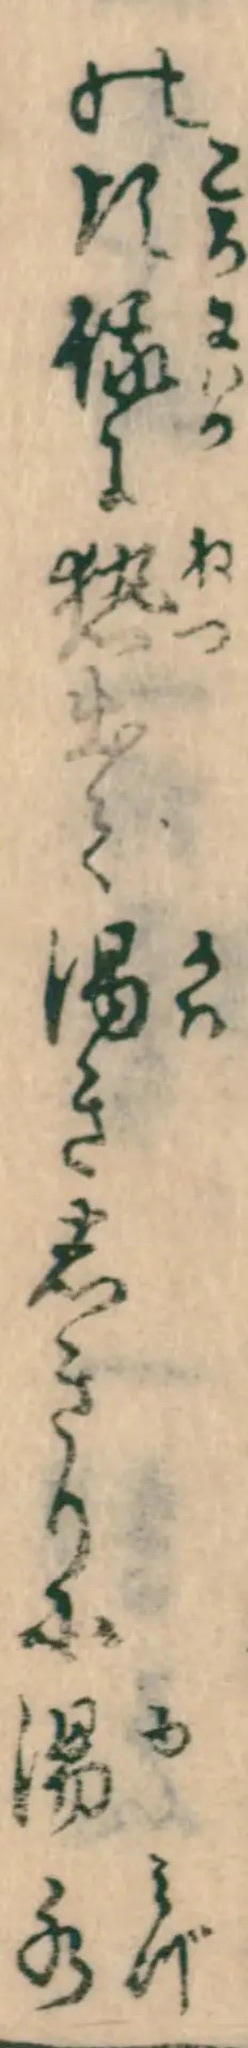の頃溘に熱出て渇きしきりに湯水
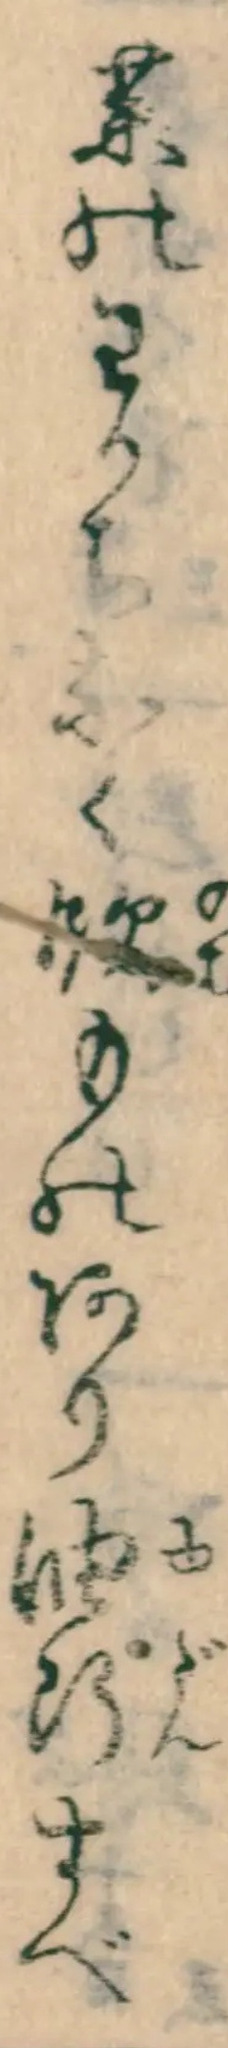薬のわかちなく飲ものあり油断すべ
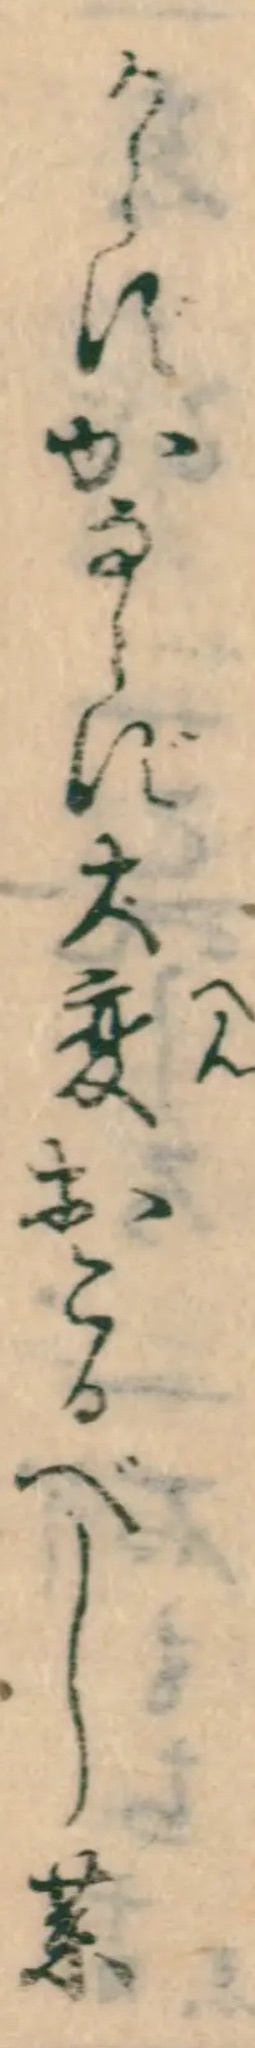からすかならず大変おこるべし薬
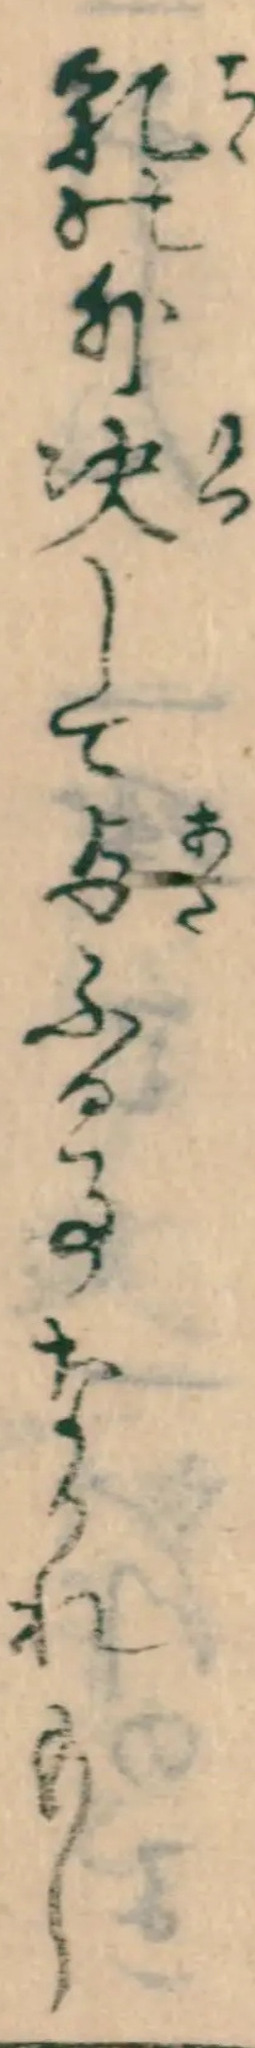乳の外決して与ふる事なかれもし
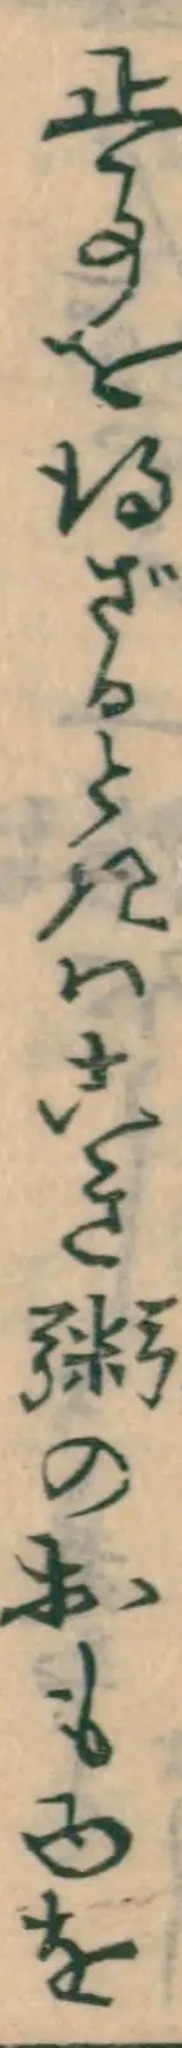止事を得ざるときはこき粥のおもゆを
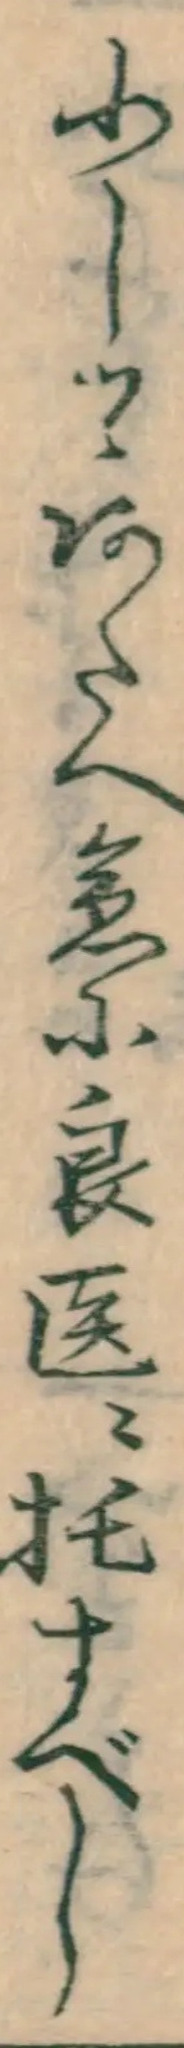少しつゝあたへ急に良医托すべし
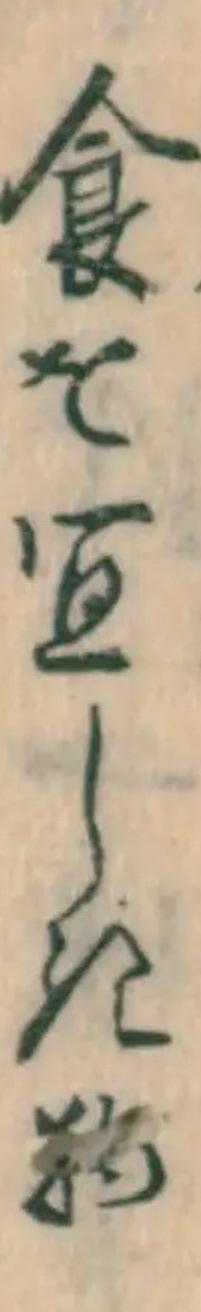食を宜しき物
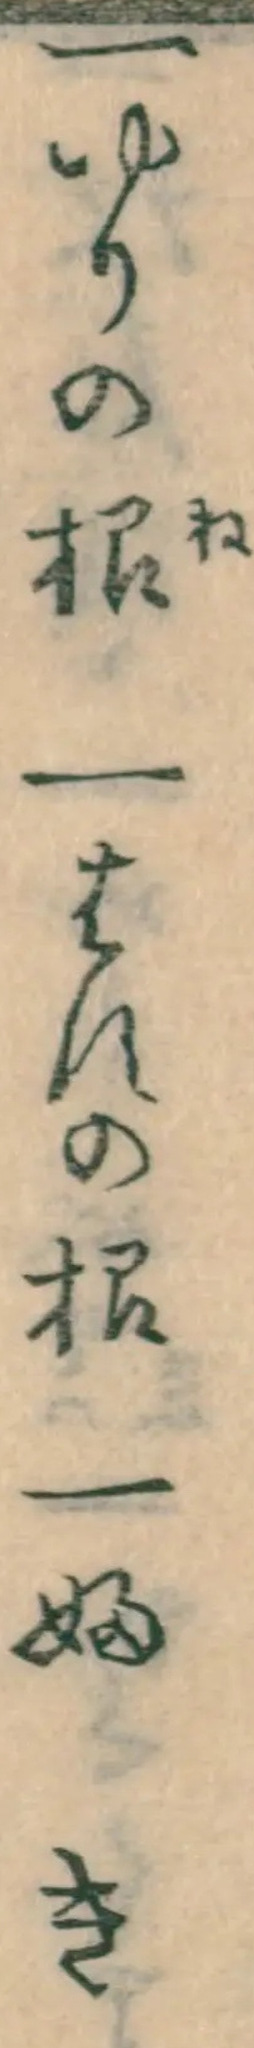一ゆりの根一はすの根一ふき
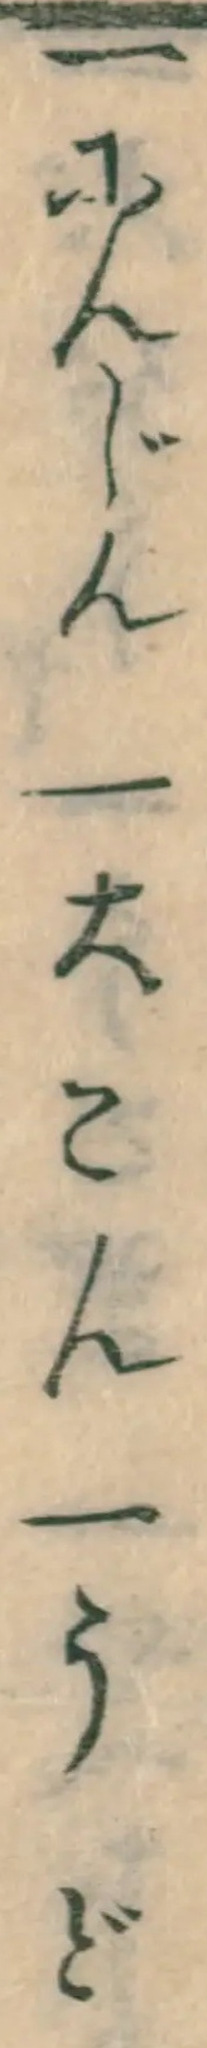一にんじん一大こん一うど
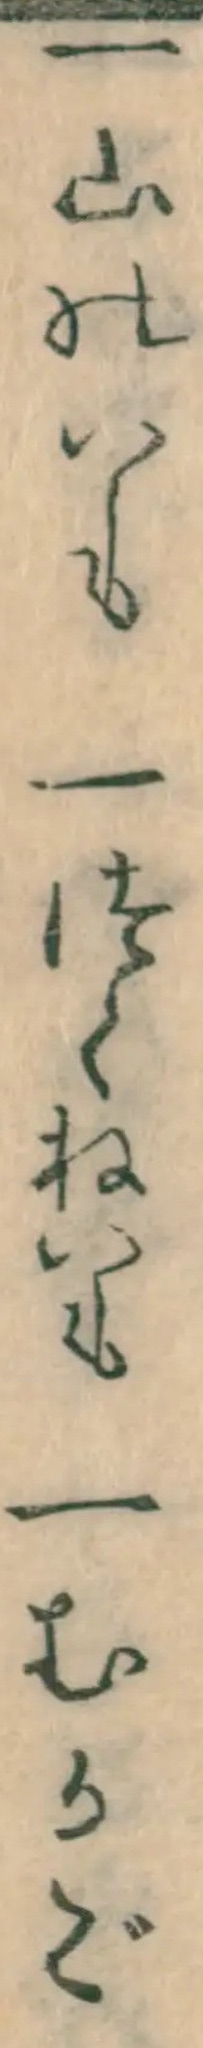一山のいも一つくねいも一むかご

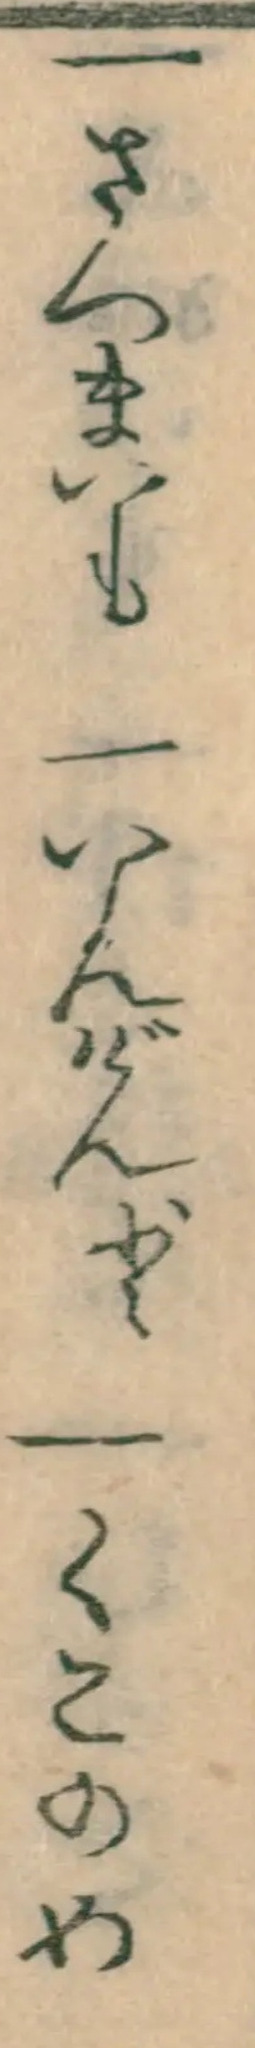一さつまいも一いんげん少々一くこのめ
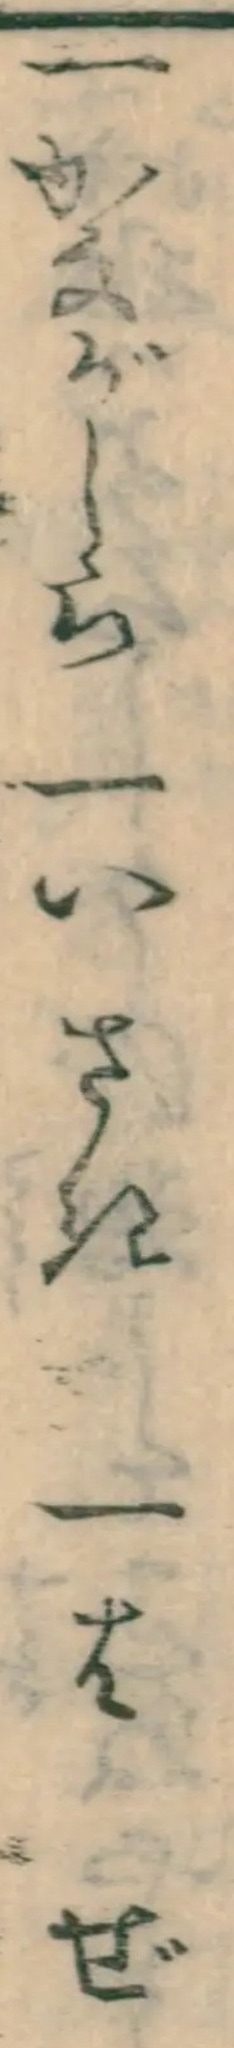一かながしら一いさき一はぜ
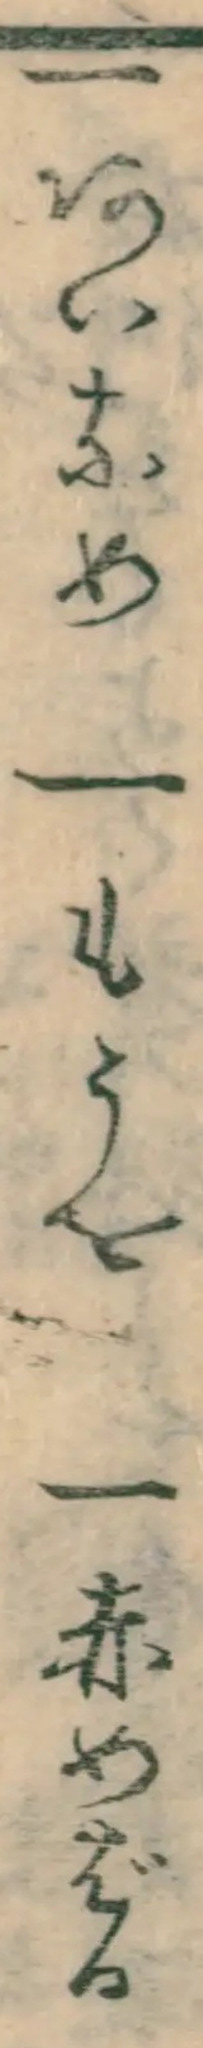一あいなめ一もうを一赤めばる
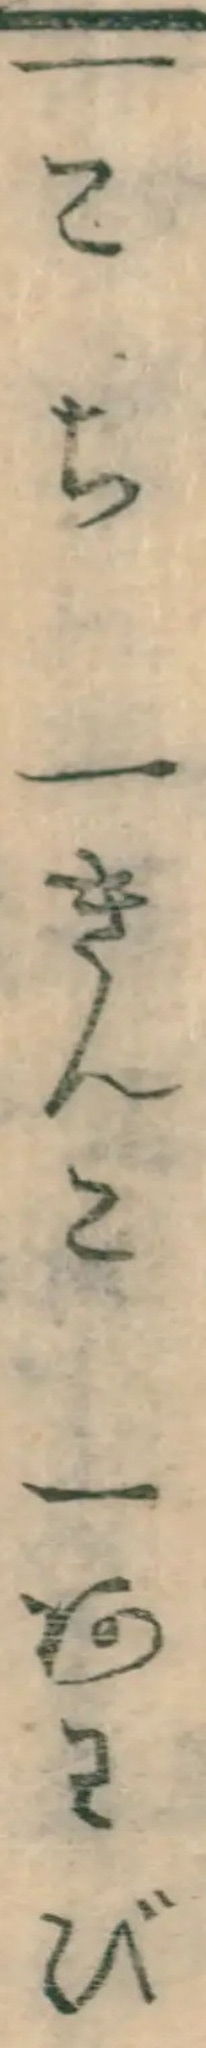一こち一きんこ一あわび

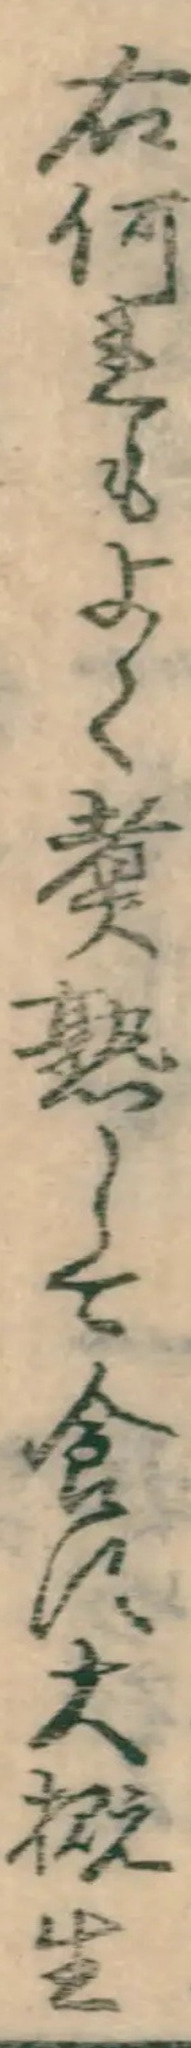右何れもよく煮熟して食す大概生
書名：疱瘡能毒記
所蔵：国立国会図書館 National Diet Library, JAPAN
